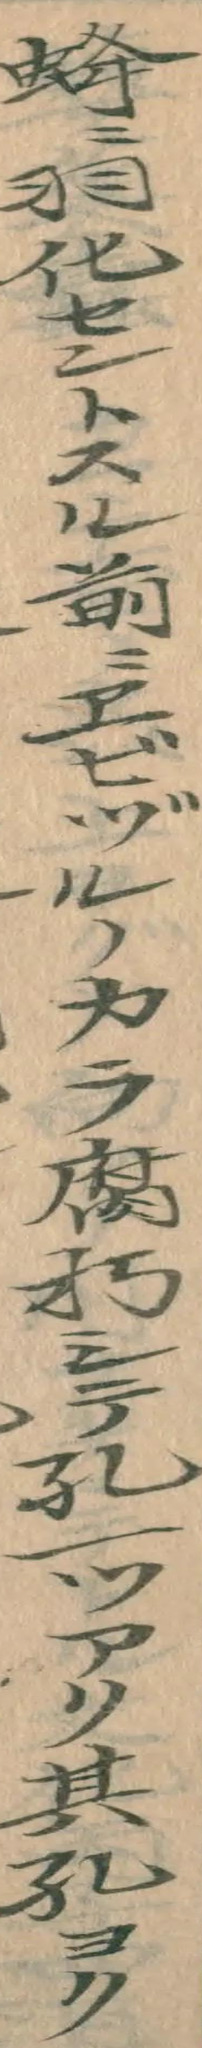蜂ニ羽化セントスル前ニヱビヅルノカラ腐朽シテ孔一ツアリ其孔ヨリ
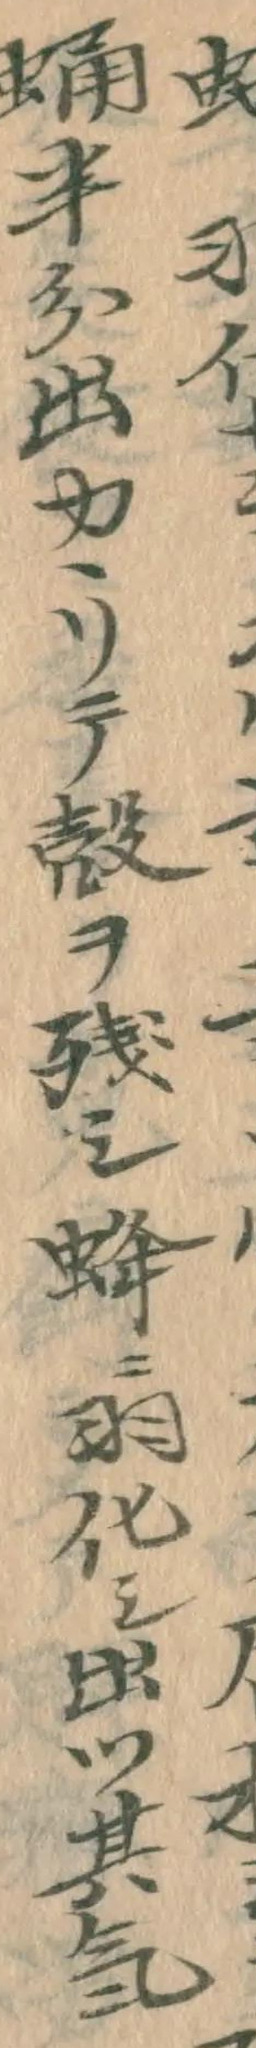蛹半分出カヽリテ殻ヲ残シ蜂ニ羽化シ出ツ其気
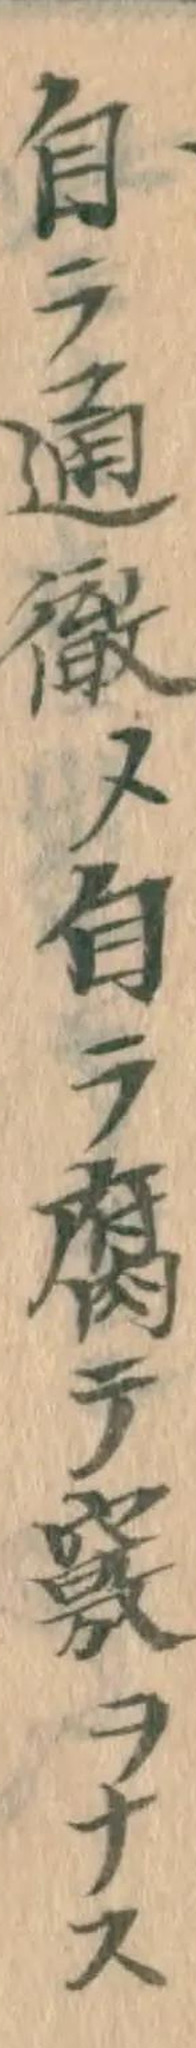自ラ通徹シテ自ラ腐テ竅ヲナス
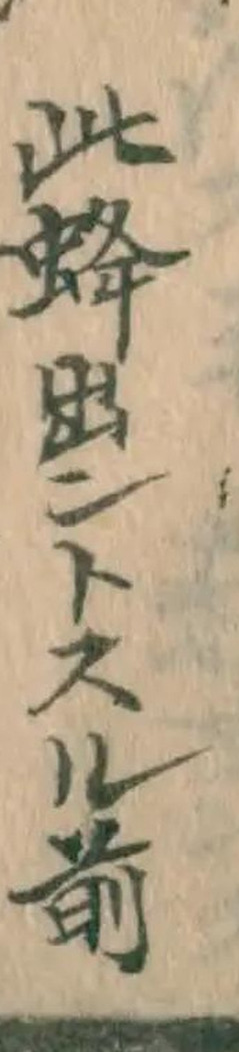此蜂出ントスル前
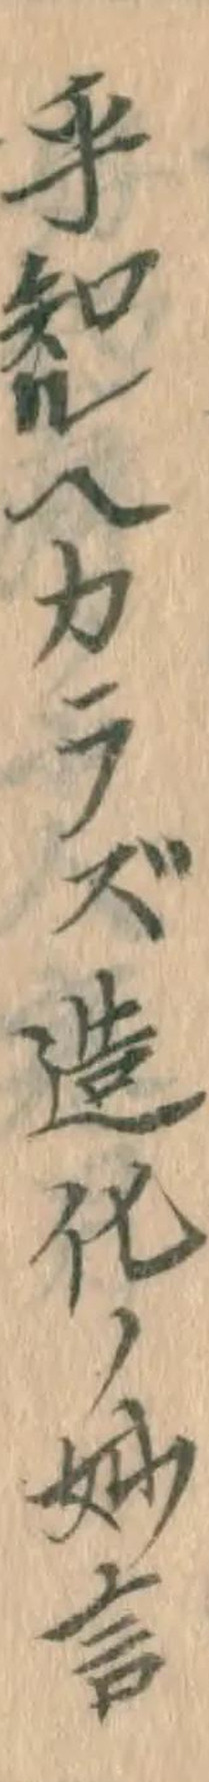乎知ルヘカラズ造化ノ妙言
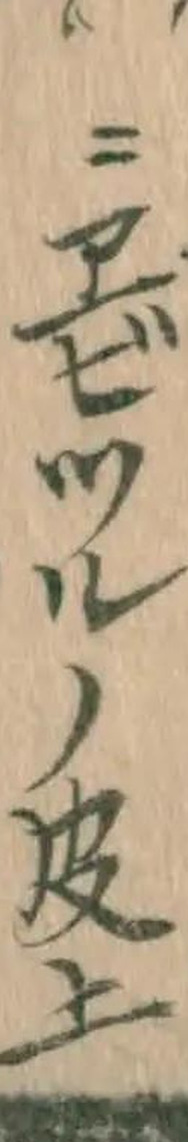ニヱビヅルノ皮上
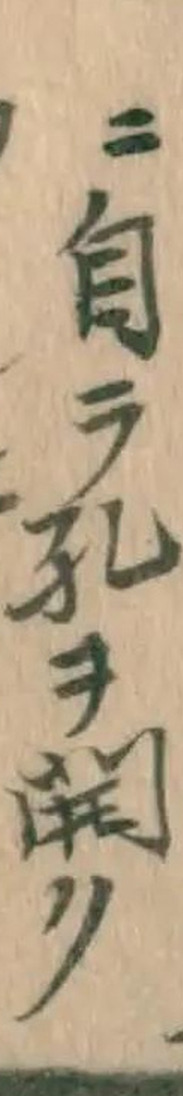ニ自ラ孔ヲ開ク
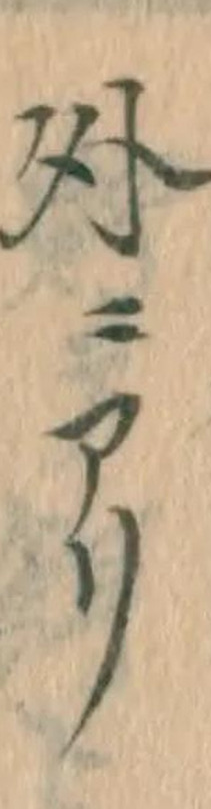外ニアリ
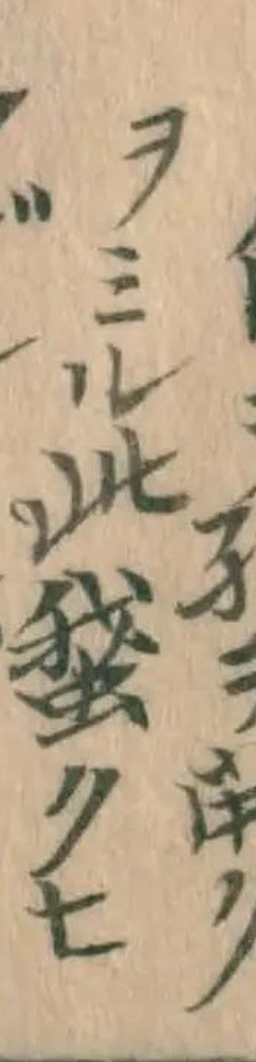ヲミル此䖸クヒ
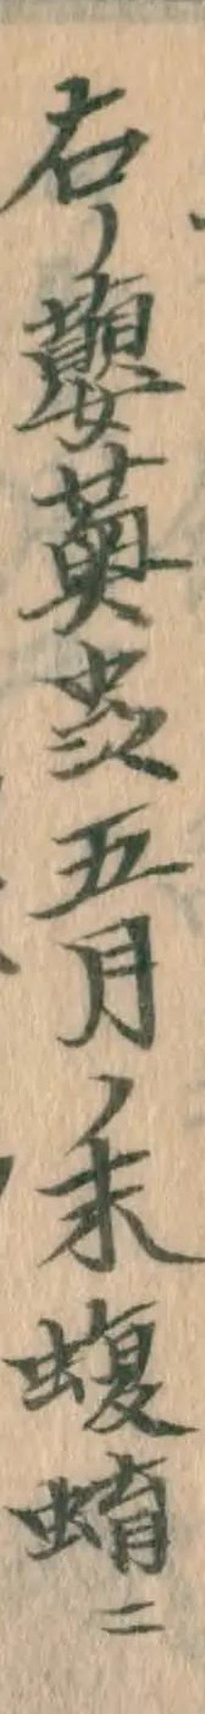右ノ蘡薁蟲五月ノ末蝮蜟ニ
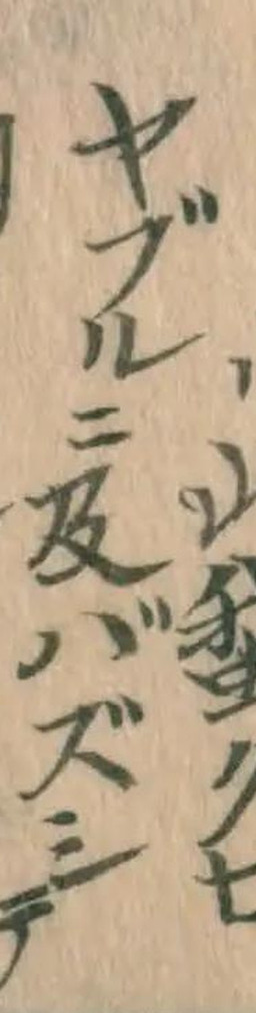ヤブルニ及バズシテ
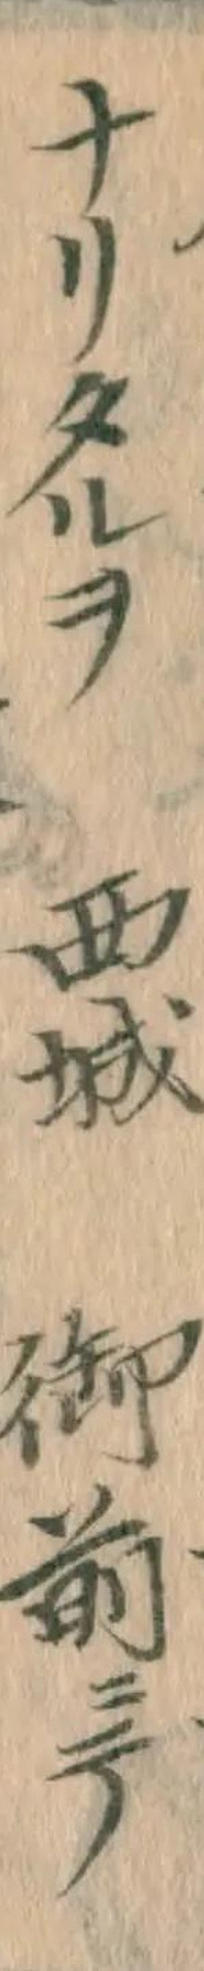ナリタルヲ西城御前ニテ
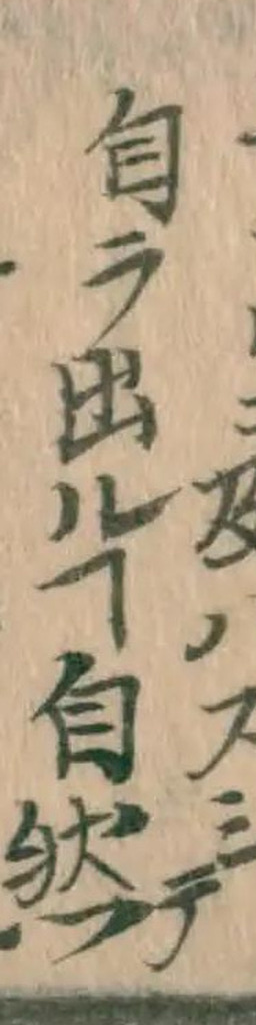自ラ出ルコト自然
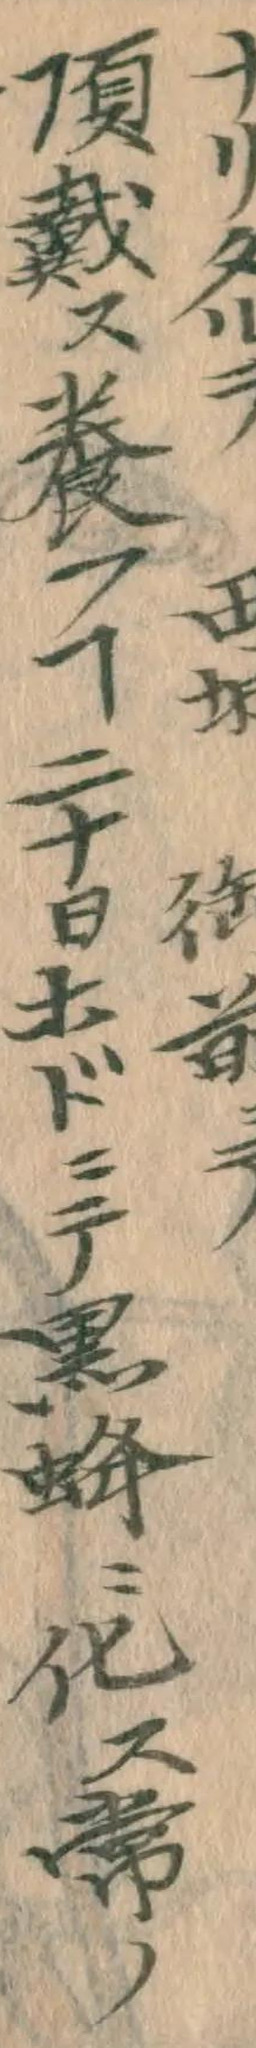頂戴ス養フコト二十日ホドニテ黒蜂ニ化ス常ノ
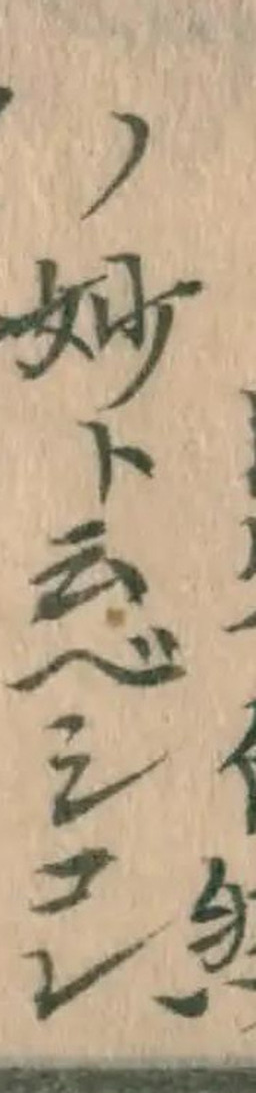ノ妙ト云ベシコレ
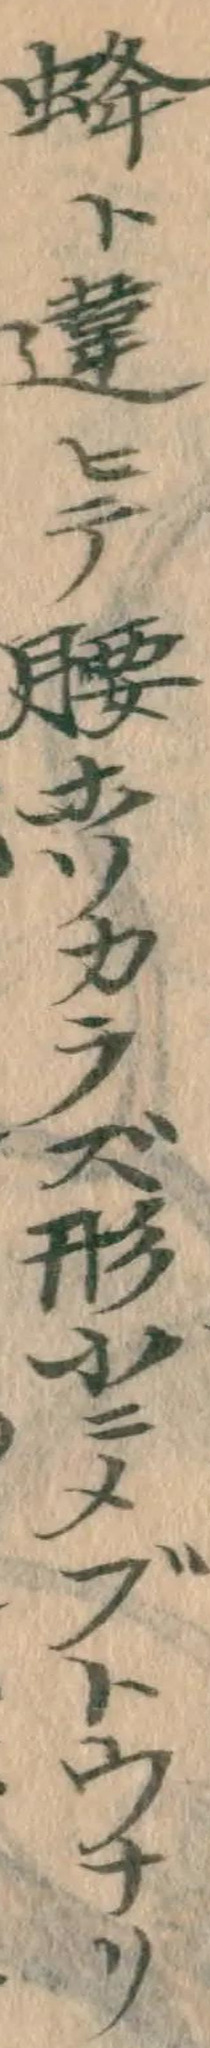蜂ト違ヒテ腰ホソカラズ形小ニシテブトウナリ
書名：千蟲譜 3巻. [2]
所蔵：国立国会図書館 National Diet Library, JAPAN
